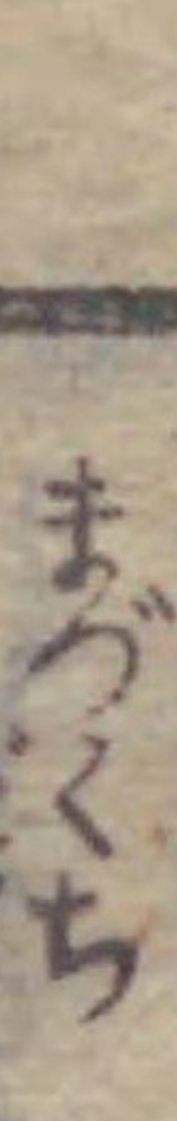まづくち
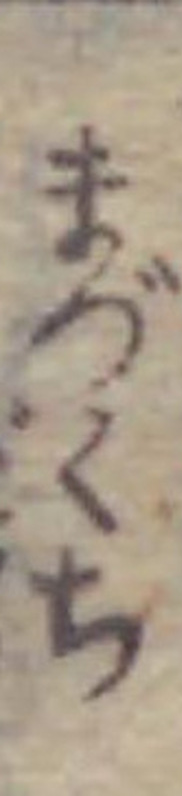まづくち
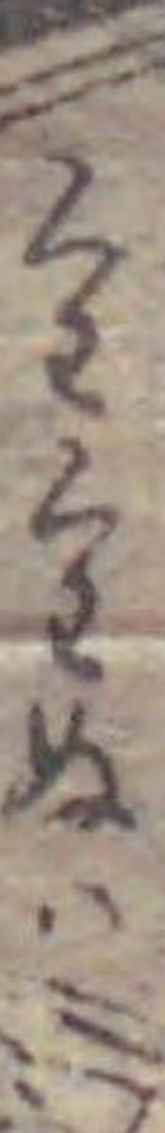くわくわぬは
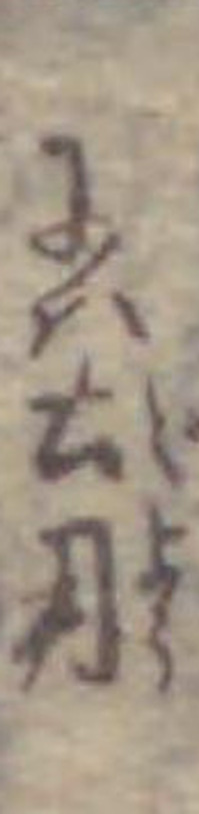には土用
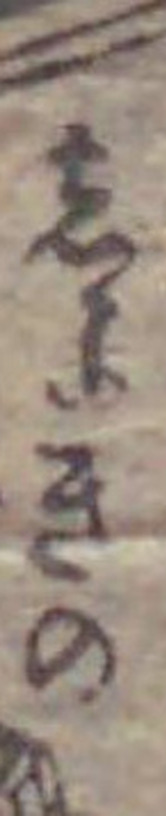しよきの
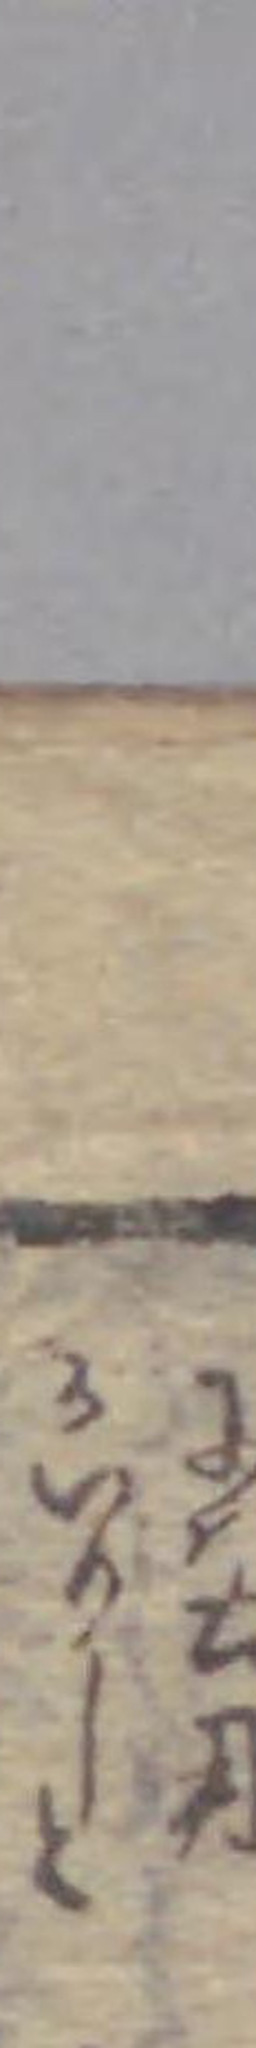かいりしと
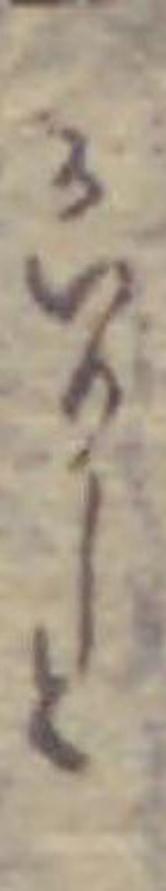かいりしと
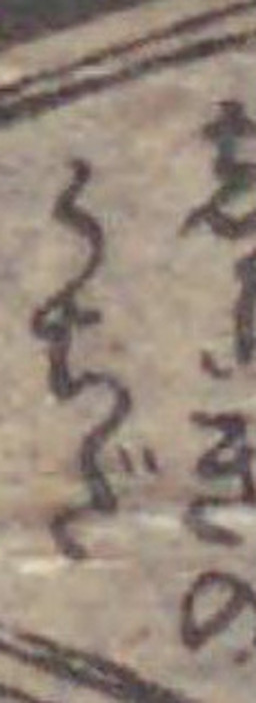うちだ
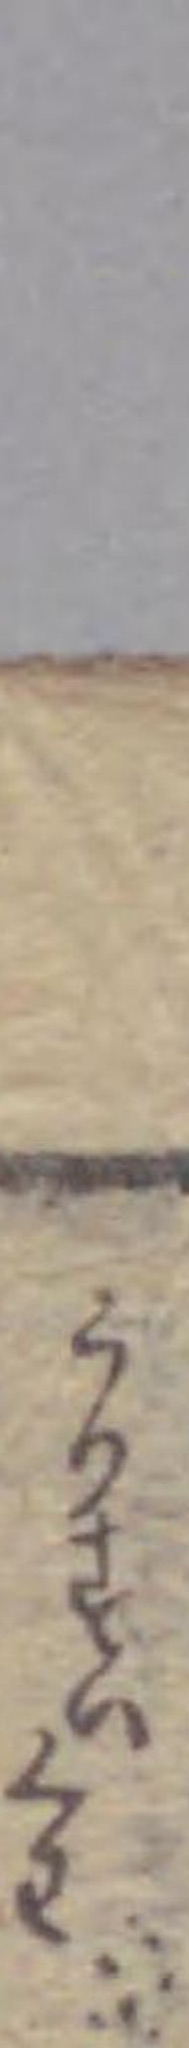うりすいくわ
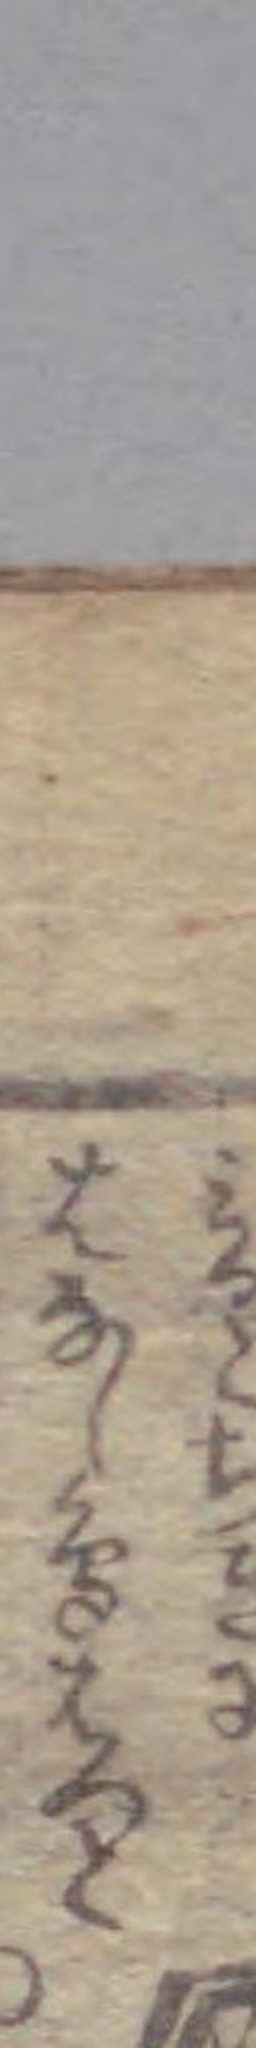はなし鳥はつと
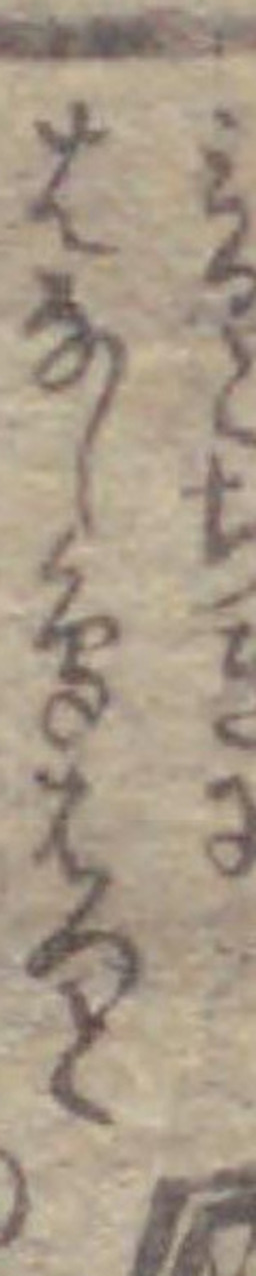はなし鳥はつと
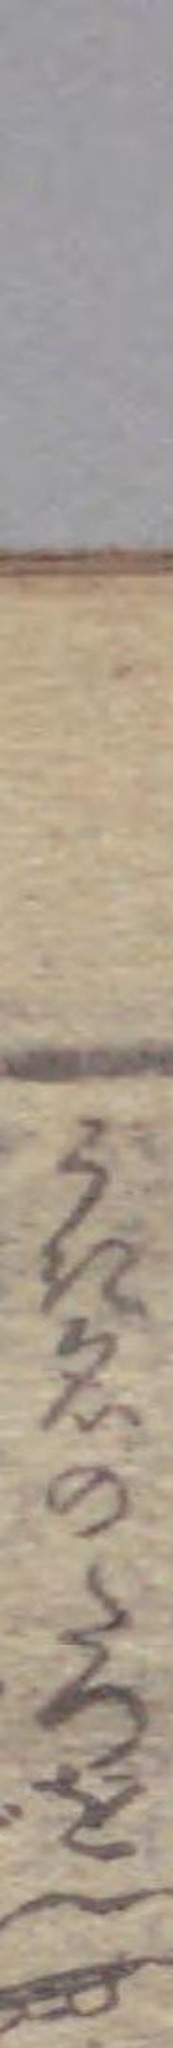うきなのたつを
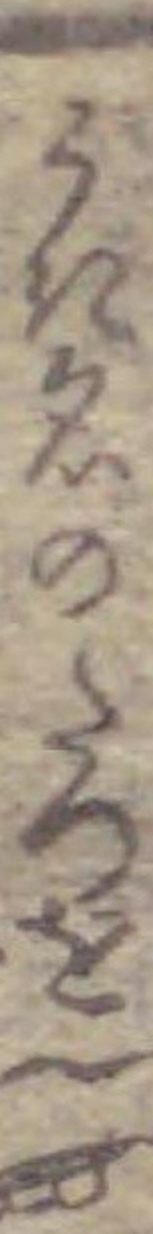うきなのたつを
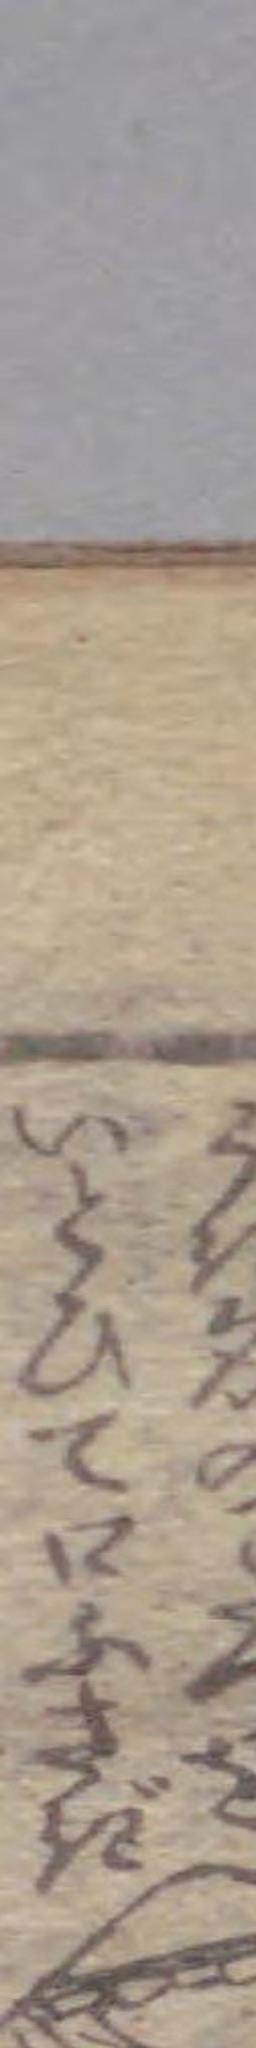いとひて口ふさぎ
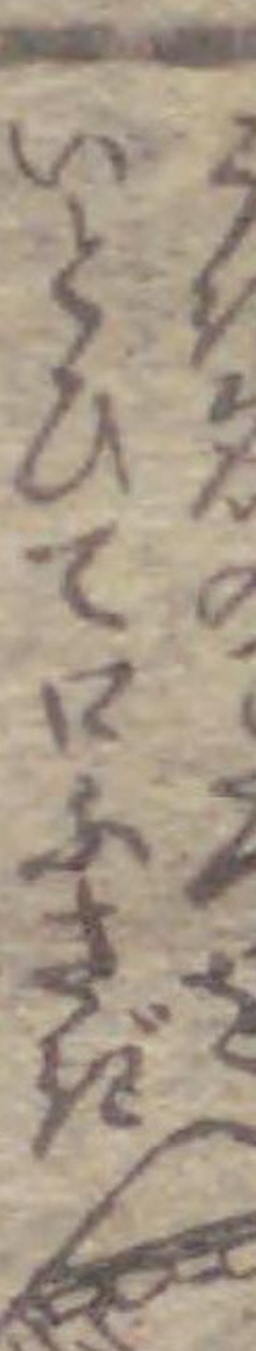いとひて口ふさぎ
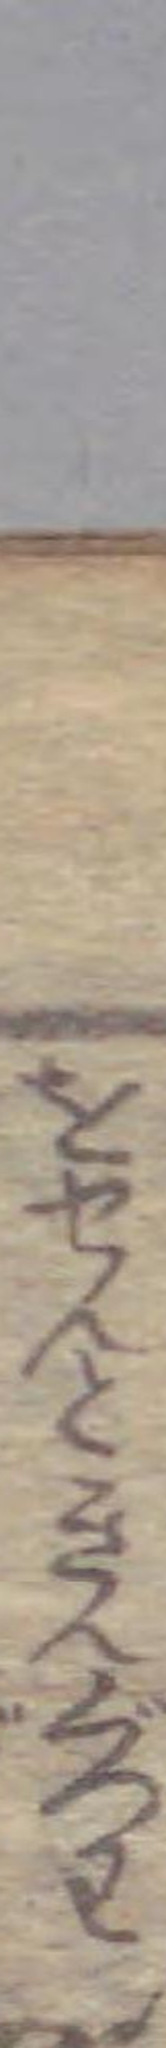をせんときんぐつわ
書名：五躰不具毒解薬 : 3巻
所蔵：国立国会図書館 National Diet Library, JAPAN
